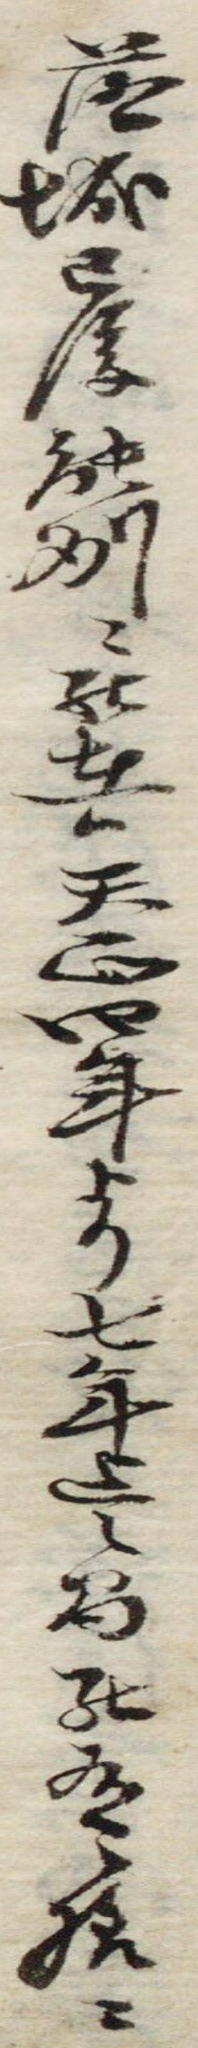落城已後能州に罷在候天正四年より七年迄之間罷有候様に
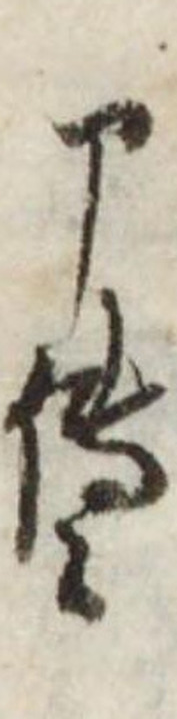申伝候
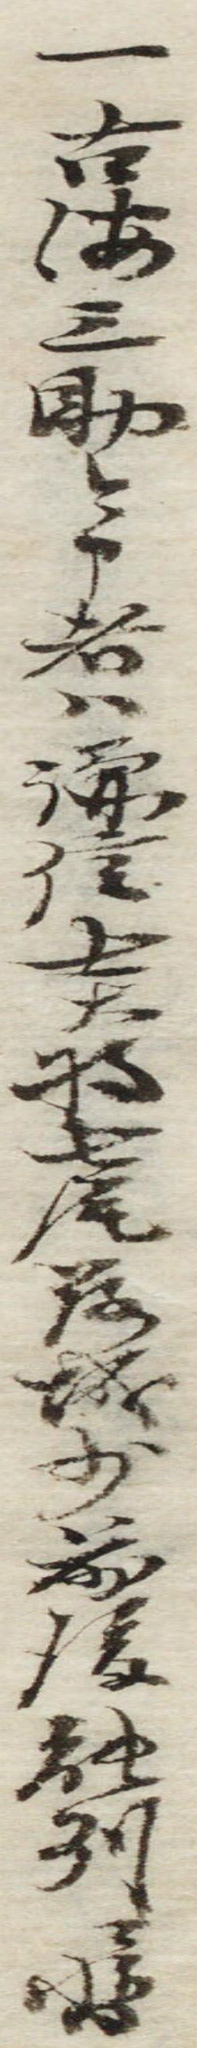一古海三助と申者は謙信士大将七尾落城少前後能州に暫
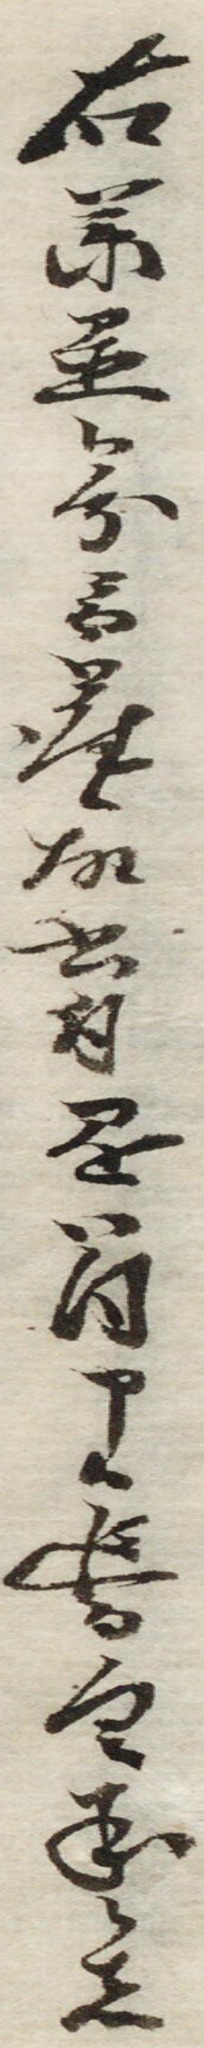右承置候分に而御座候故書付懸は同申候追而具承候は
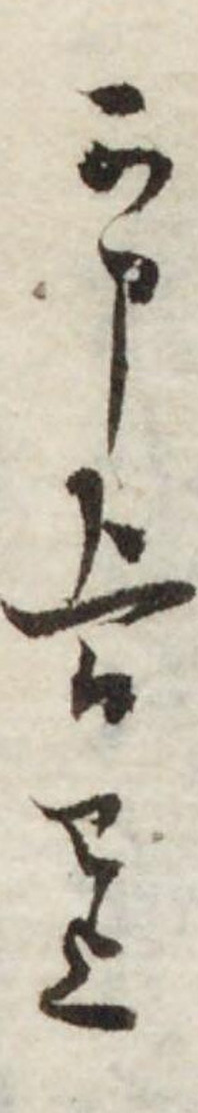可申上候已上
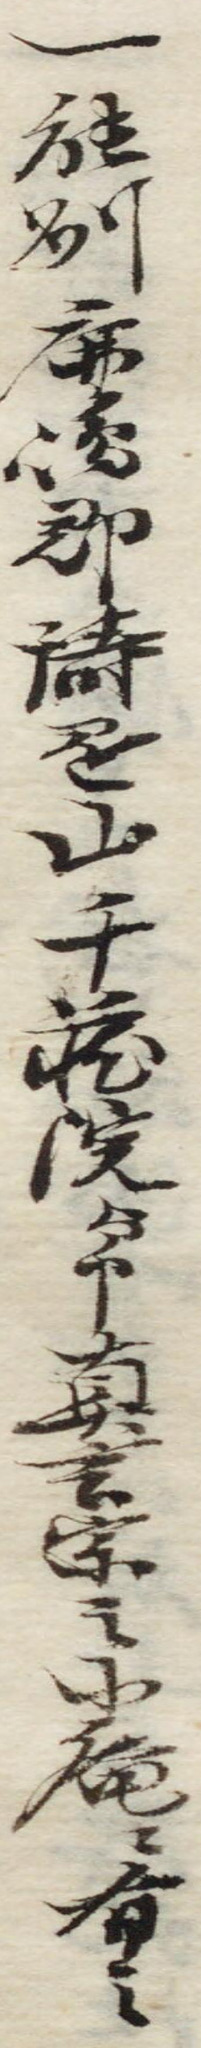一能州鹿嶋郡禱懸山千蔵院与申真言宗之小庵に有之
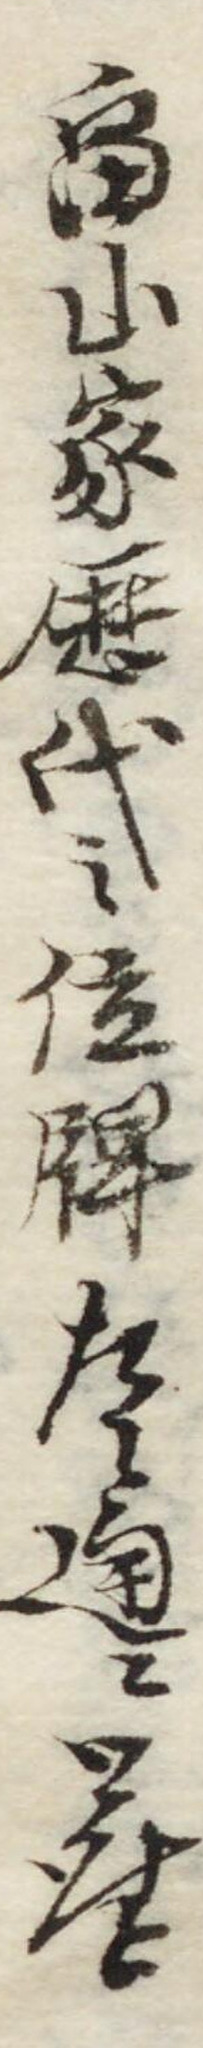畠山家歴代之位牌左之通に御座候
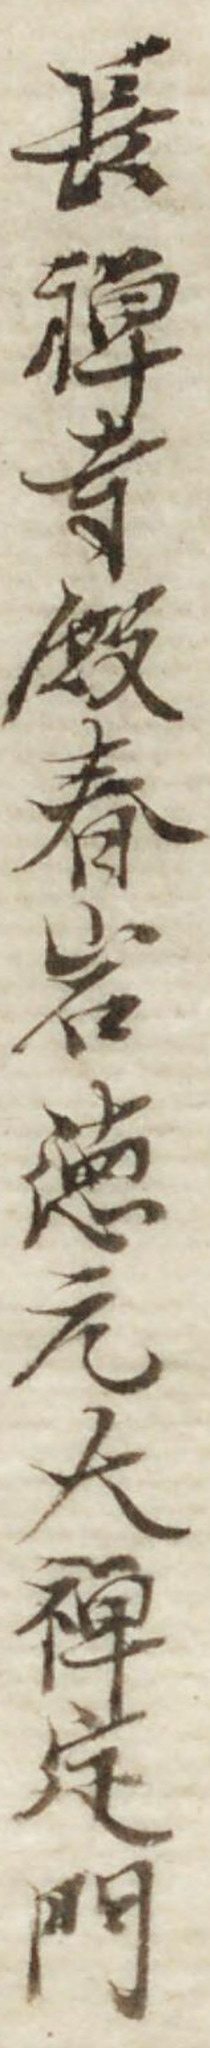長禅寺殿春岩徳元大禅定門
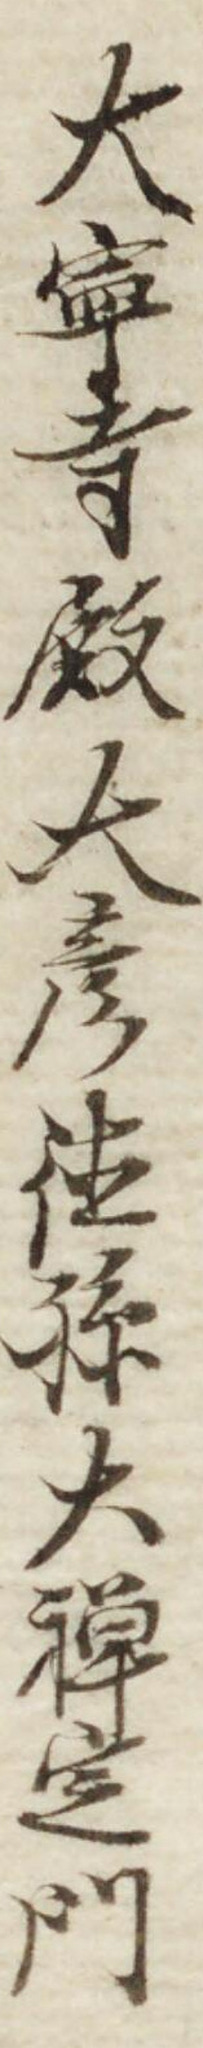大寧寺殿大彦徳孫大禅定門
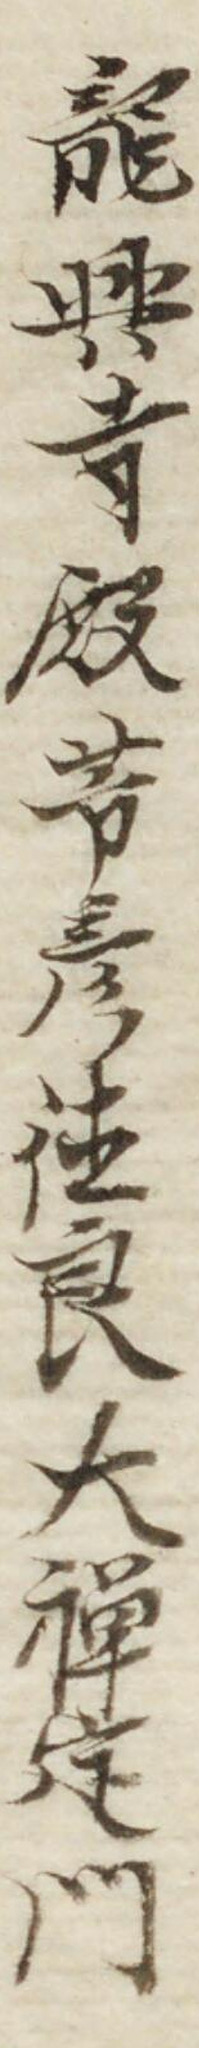龍興寺殿芳彦徳良大禅定門
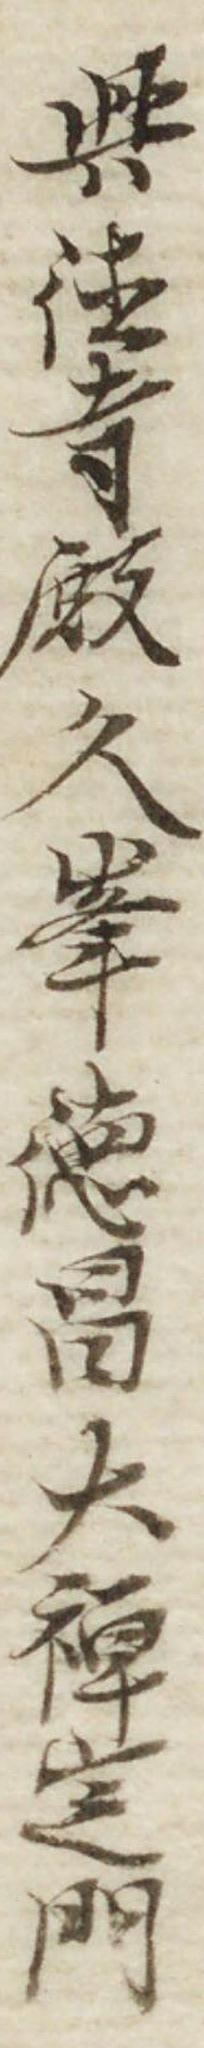興徳寺殿久峯徳昌大禅定門
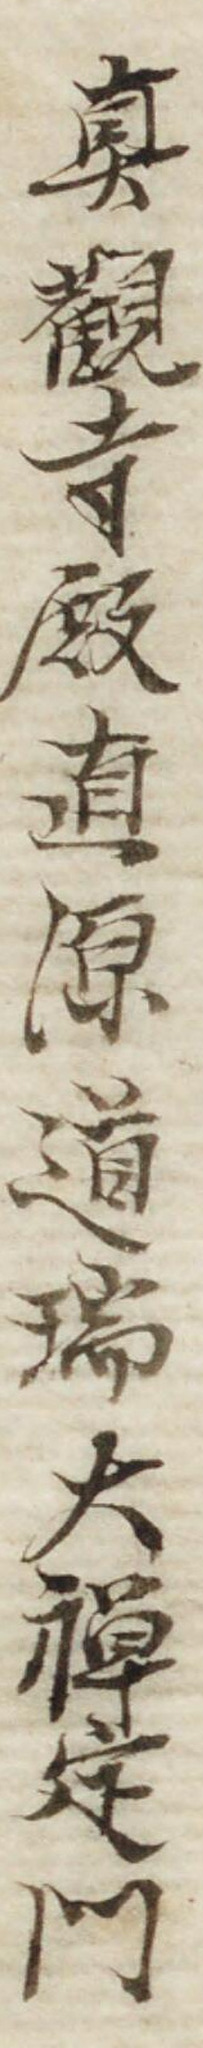真観寺殿直源道瑞大禅定門
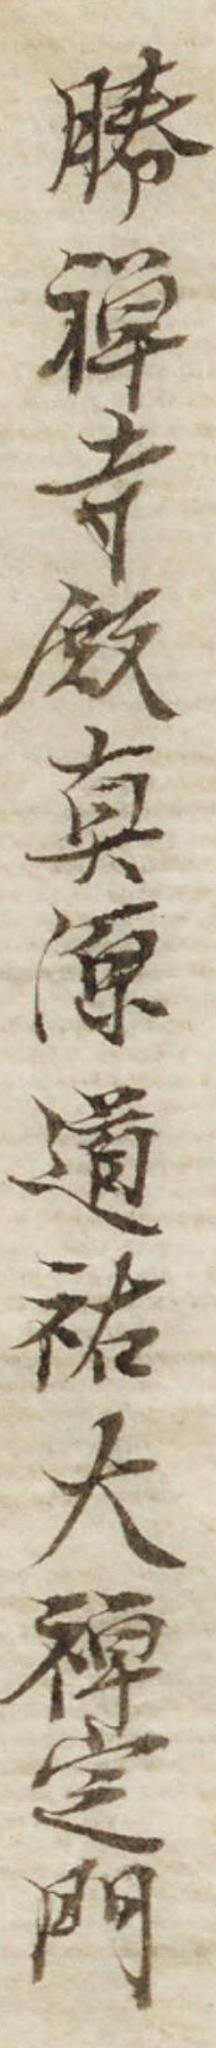勝禅寺殿真源道祐大禅定門
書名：古老紀談等
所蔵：Ishikawa Prefectural Library
